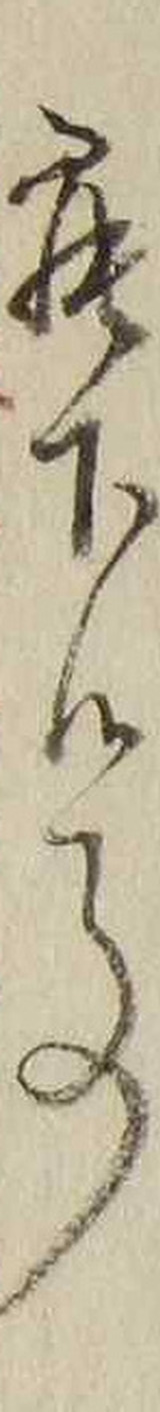罷下候事
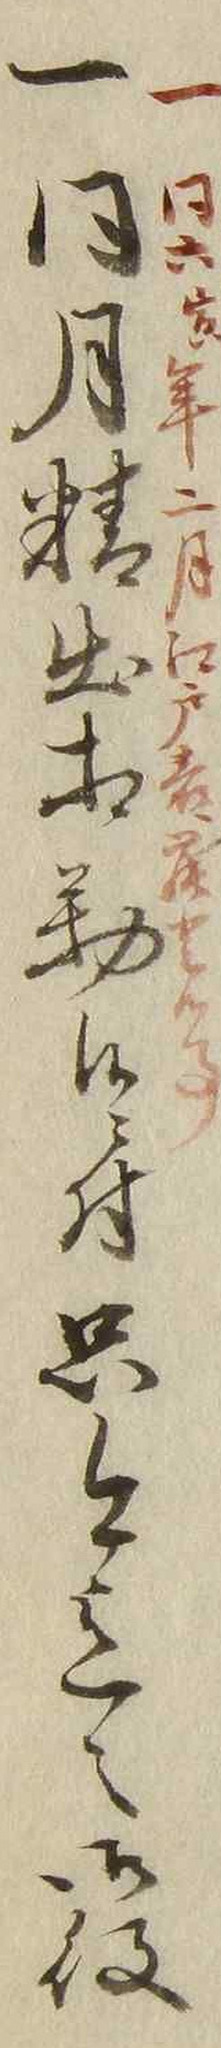一同月精出相勤候ニ付只今迄之御役

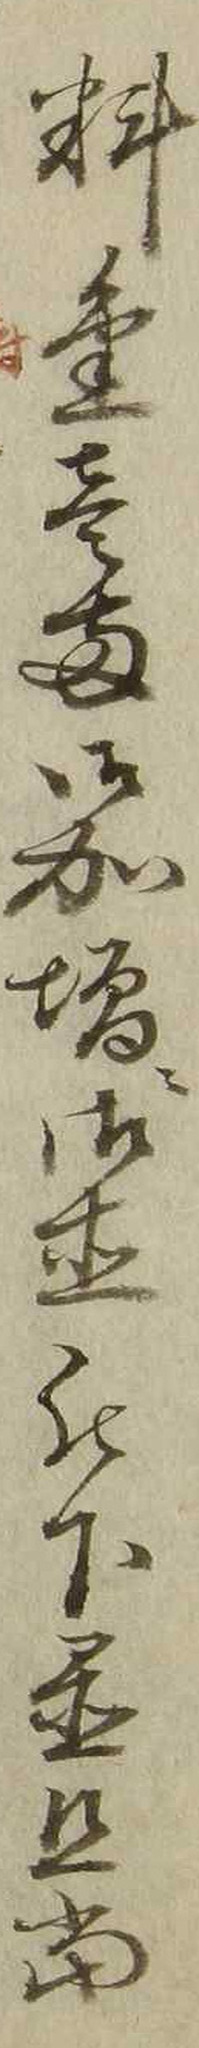料金壱両御加増ニ御直被下置且当
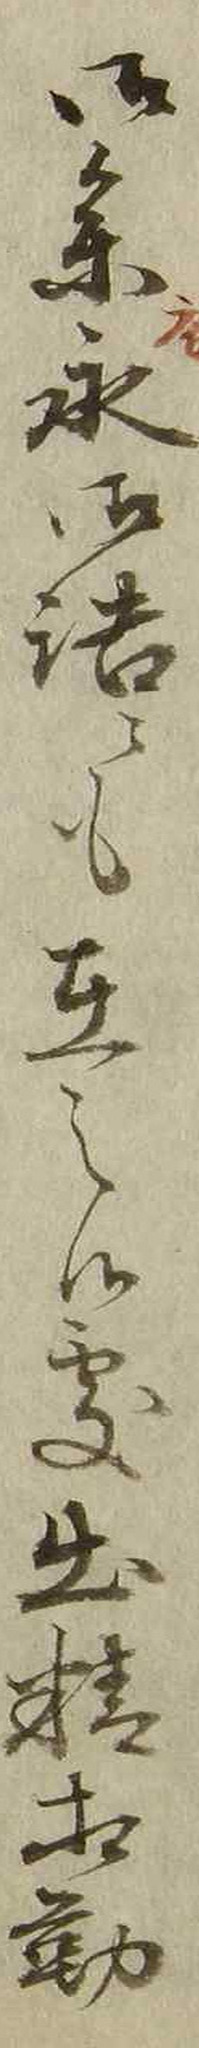御参永御詰ニも在之候処出精相勤
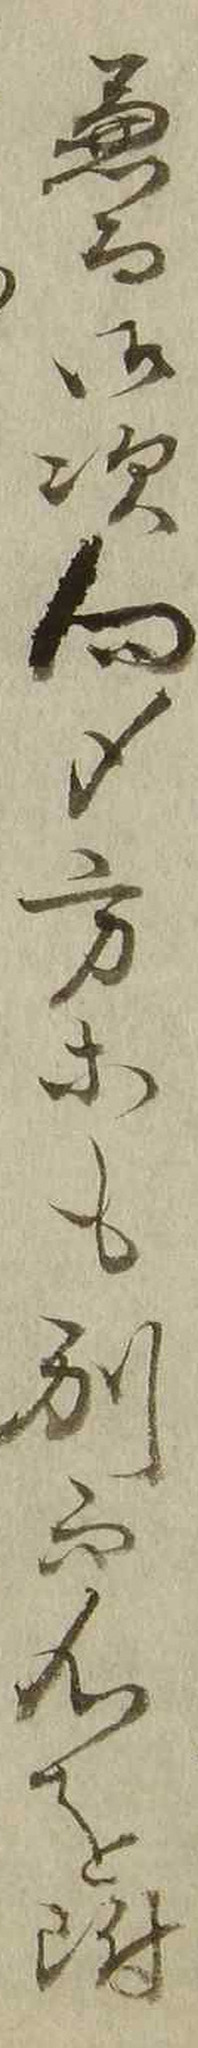兼而御次向〆方等も別而心を附
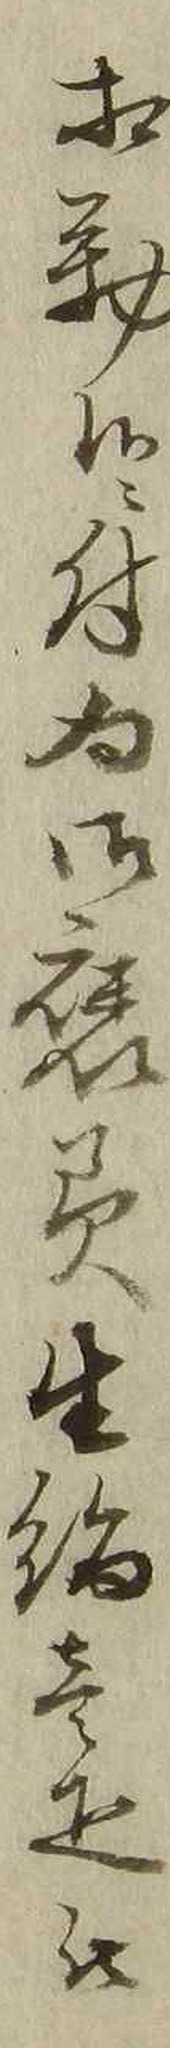相勤候ニ付為御褒美生絹壱疋被
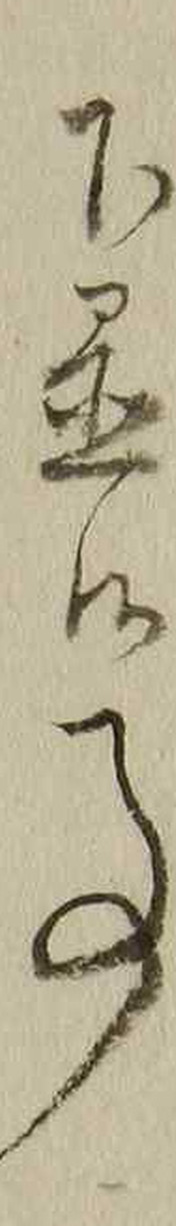下置候事
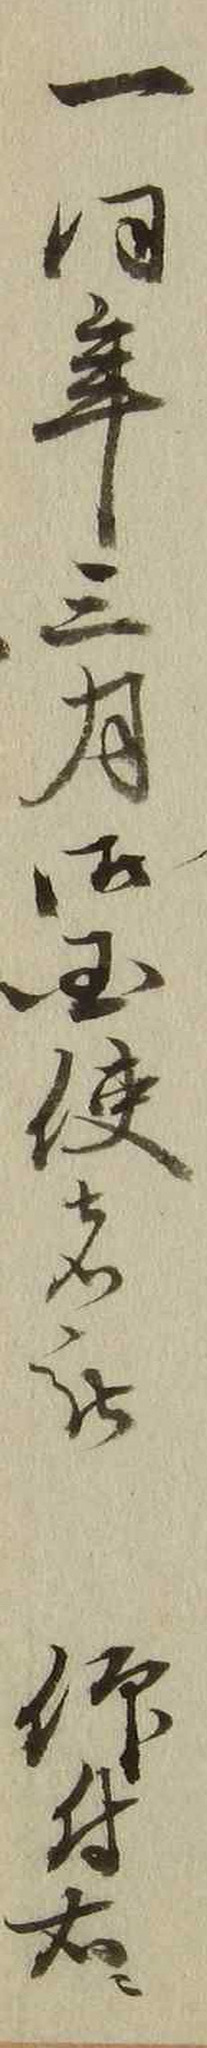一同年三月御国使者被仰付右ニ
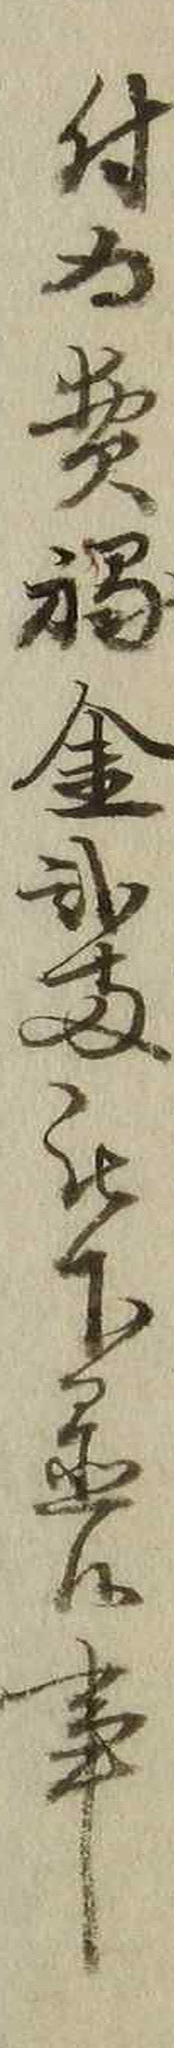付為費補金弐両被下置候事
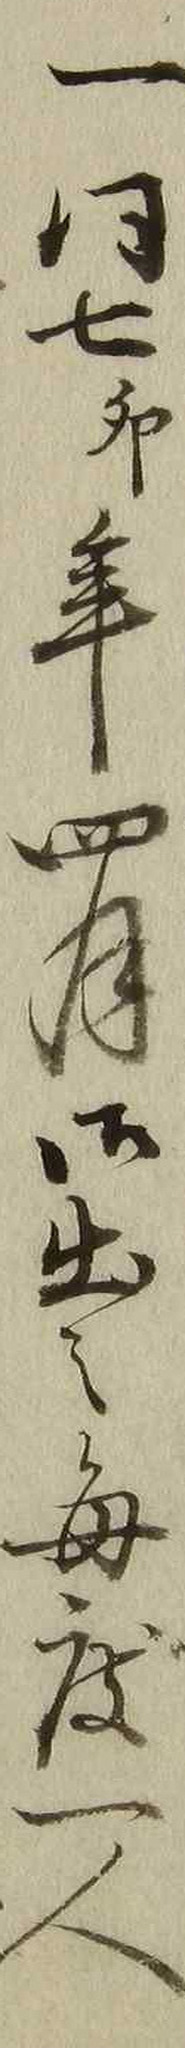一同七卯年四月御出之毎度人一
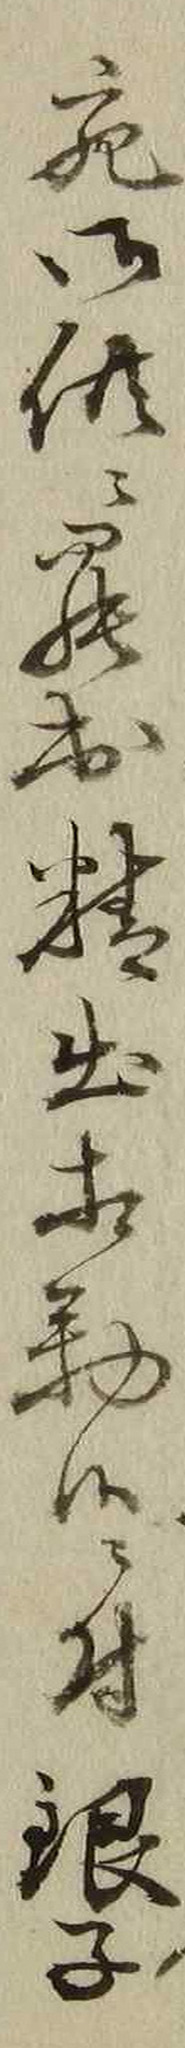宛御供ニ罷出精出相勤候ニ付銀子
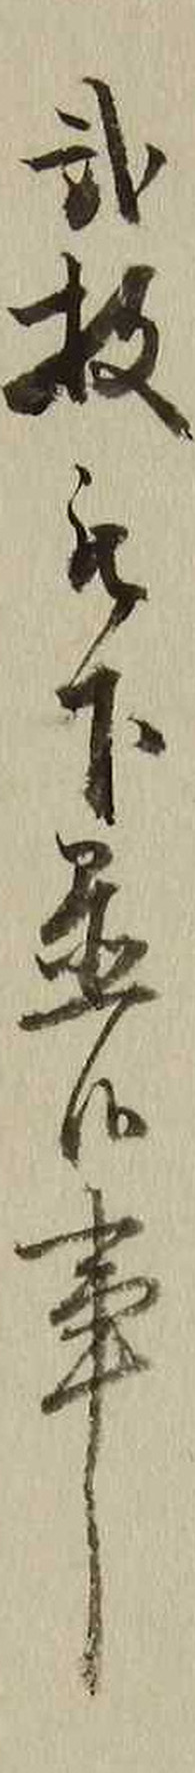弐枚被下置候事
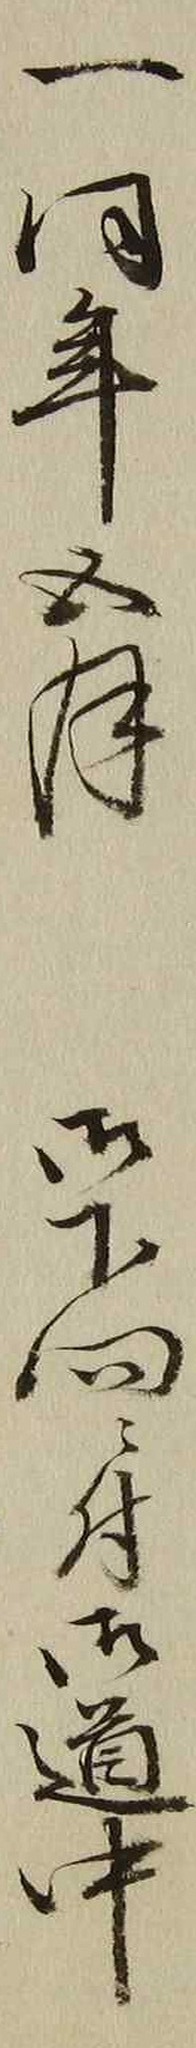一同年五月御下向ニ付御道中
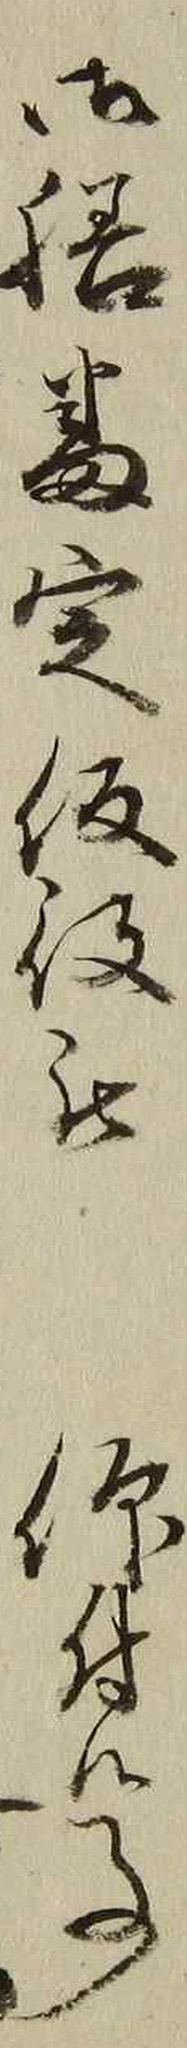御膳番定仮役被仰付候事
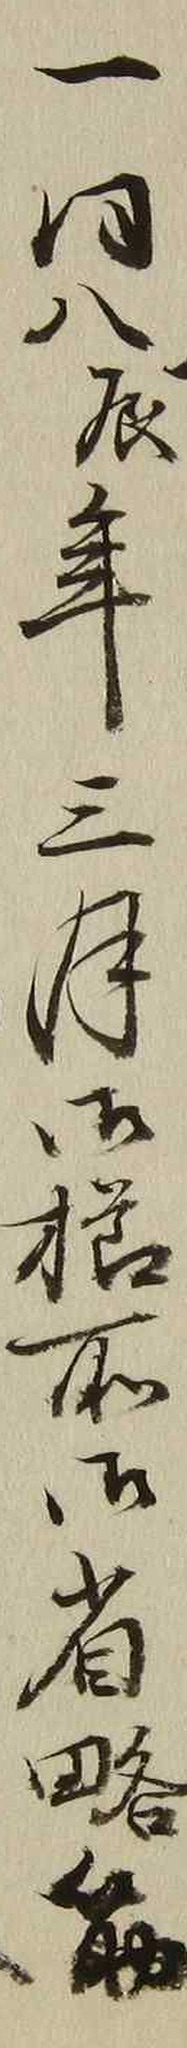一同八辰年三月御櫛所御者略筋
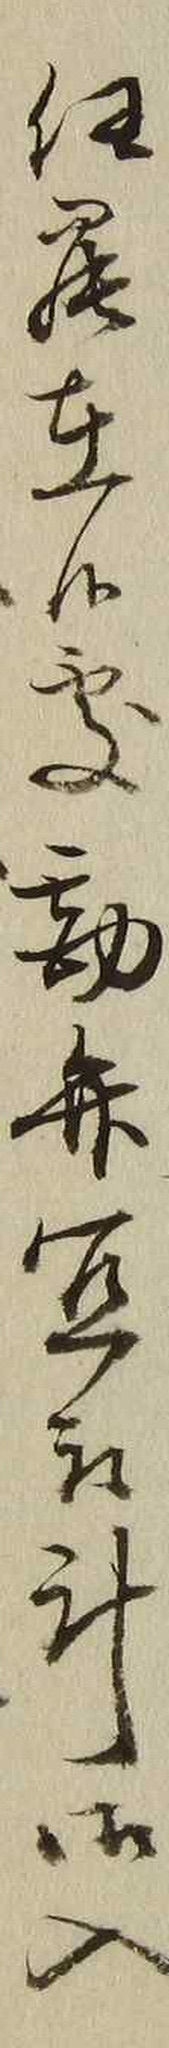任罷在候処勤弁宜取計御入
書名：諸士系譜　巻之36　は之部4
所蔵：会津若松市立会津図書館
